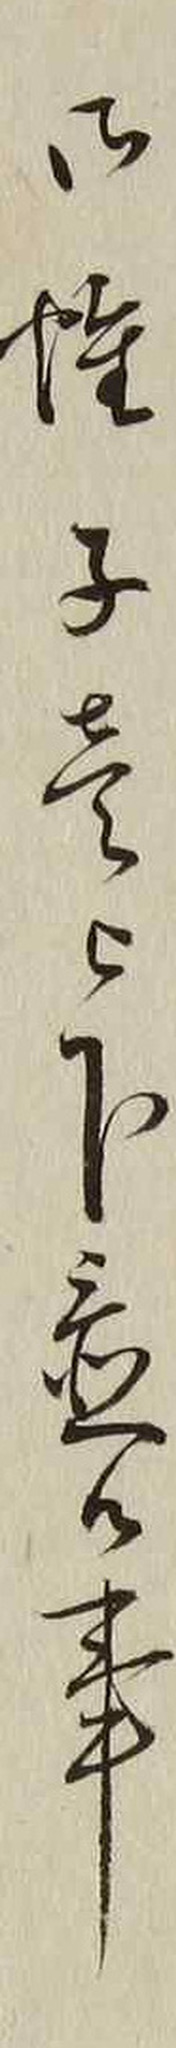御帷子壱被下置候事
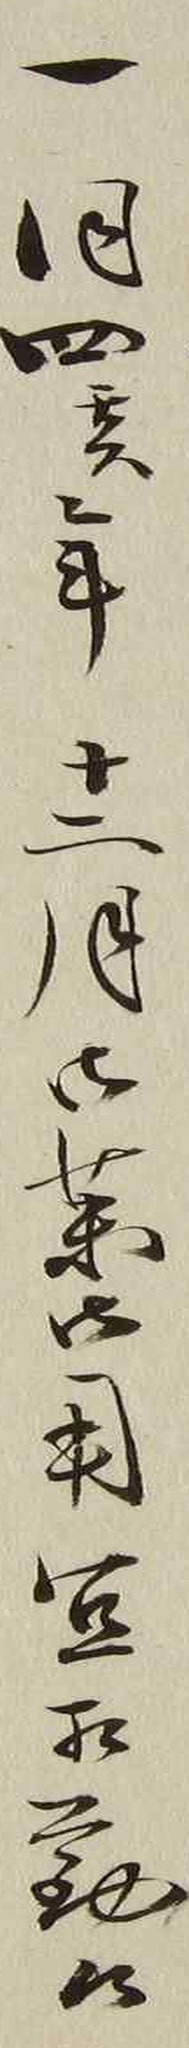一同四亥年十二月御薬御用宜相勤候
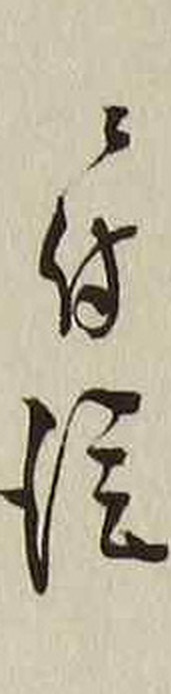に付従
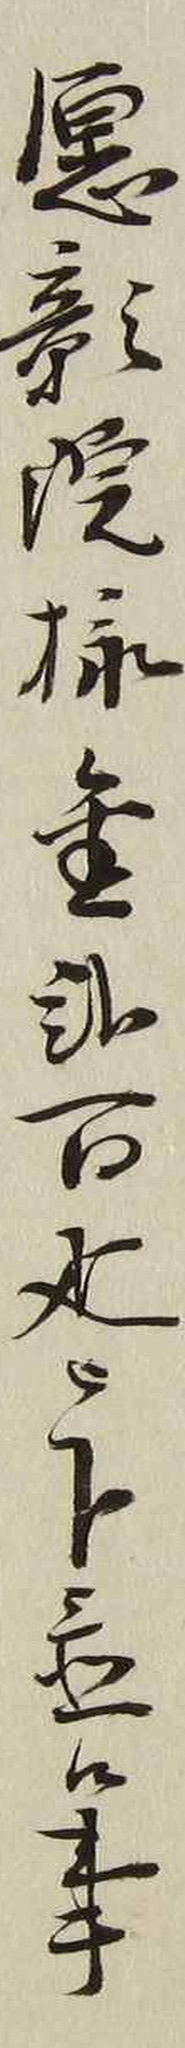愿彰院様金弐百疋被下置候事
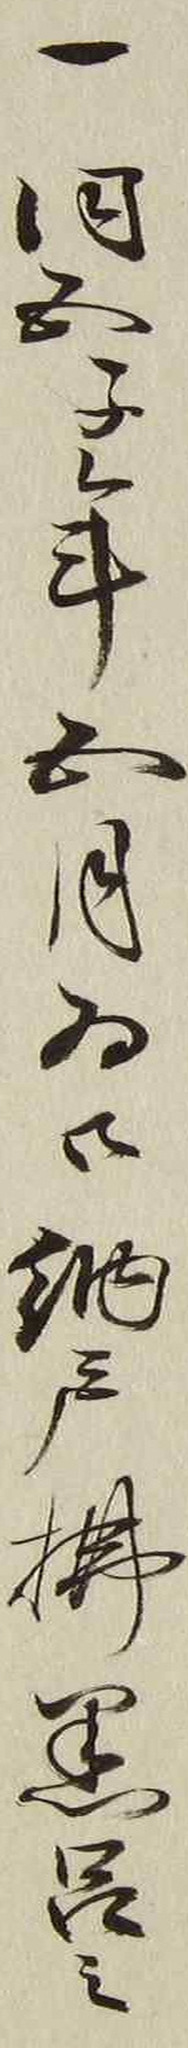一同五子年五月為御納戸払黒呂之
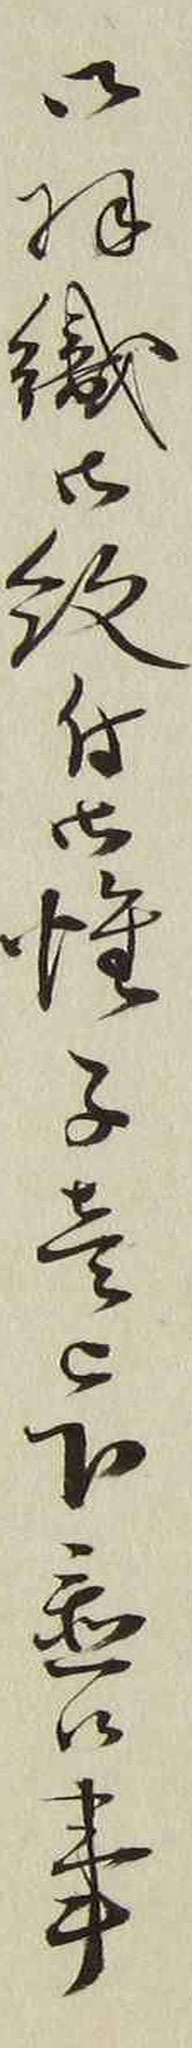御羽織御紋付御帷子壱被下置候事
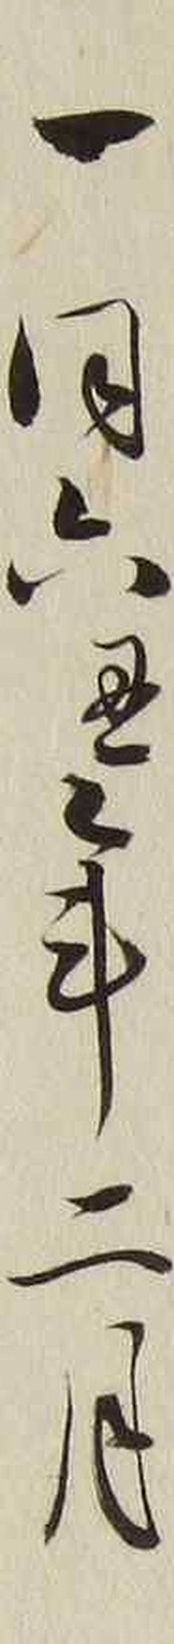一同六丑年二月
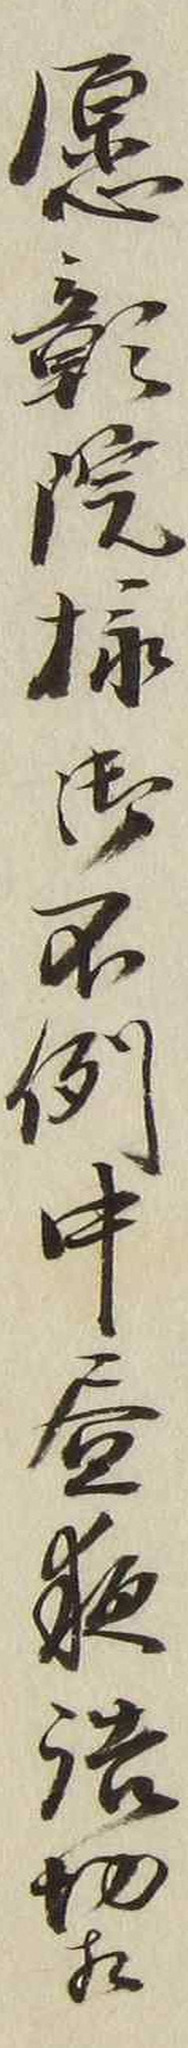愿彰院様御不例中昼夜詰切相

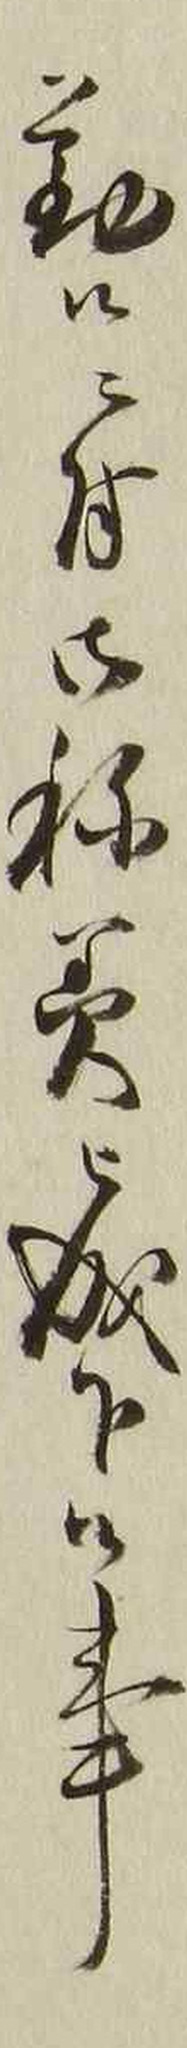勤候に付御称美被成下候事
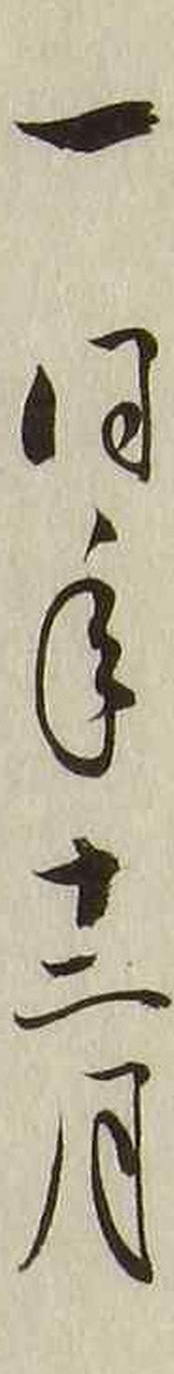一同年十二月
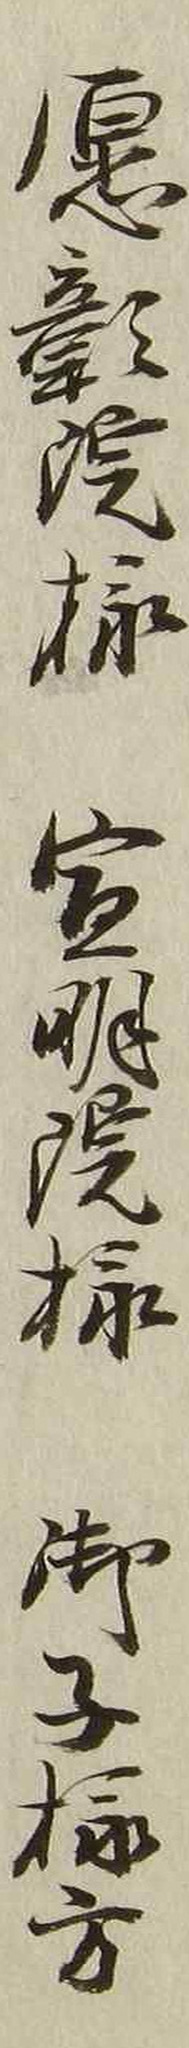愿彰院様宣明院様御子様方
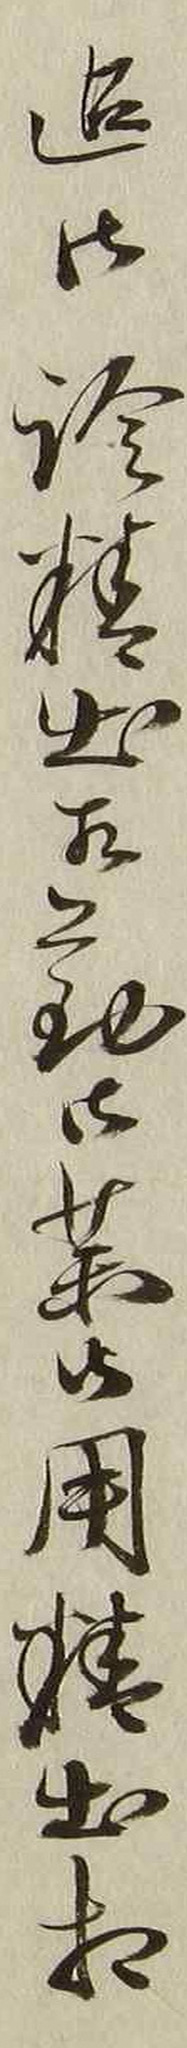迄御診精出相勤御薬御用精出相
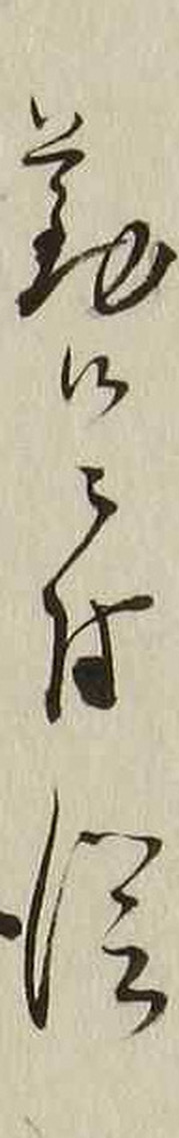勤候に付従
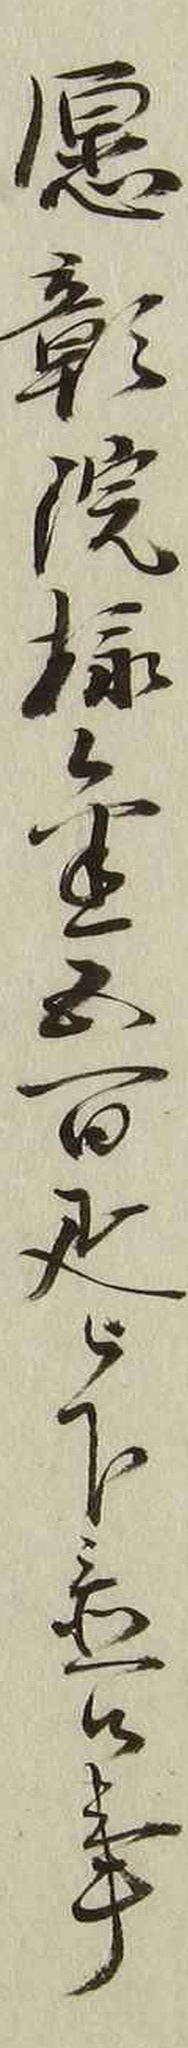愿彰院様金五百疋被下置候事
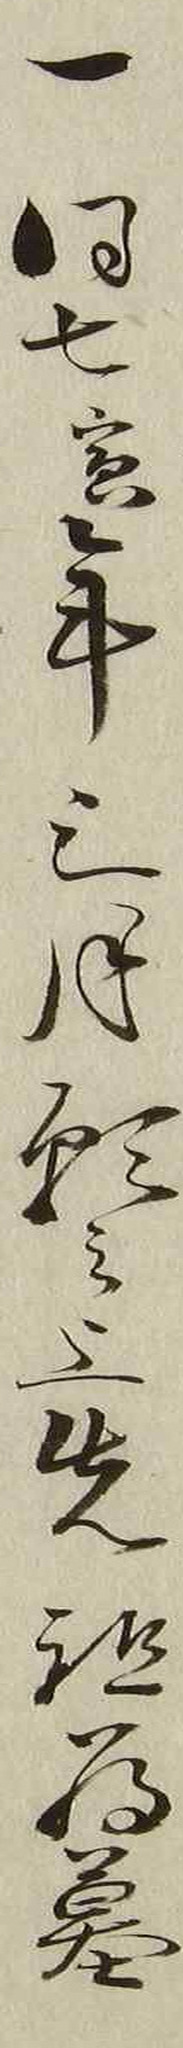一同七寅年三月願之上先祖為墓
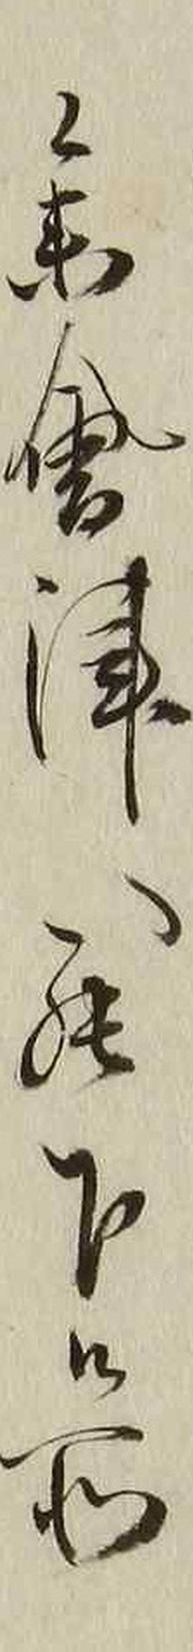参会津へ罷下候所
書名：諸士系譜　巻之157　ね之部1
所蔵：会津若松市立会津図書館
